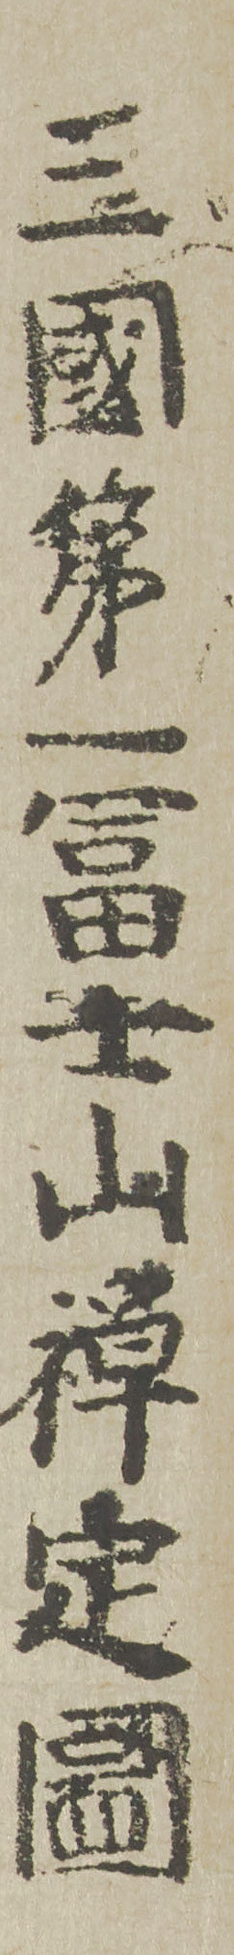三国第一冨士山禅定図
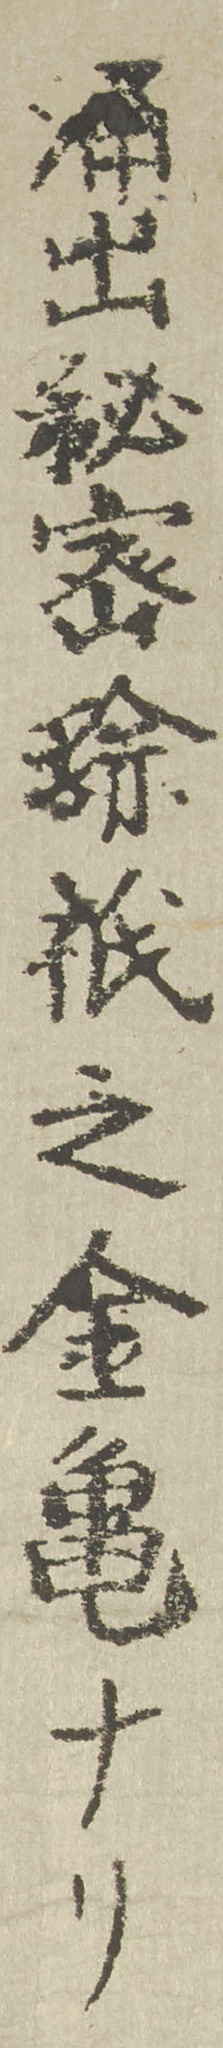涌出秘密祇之金亀ナリ
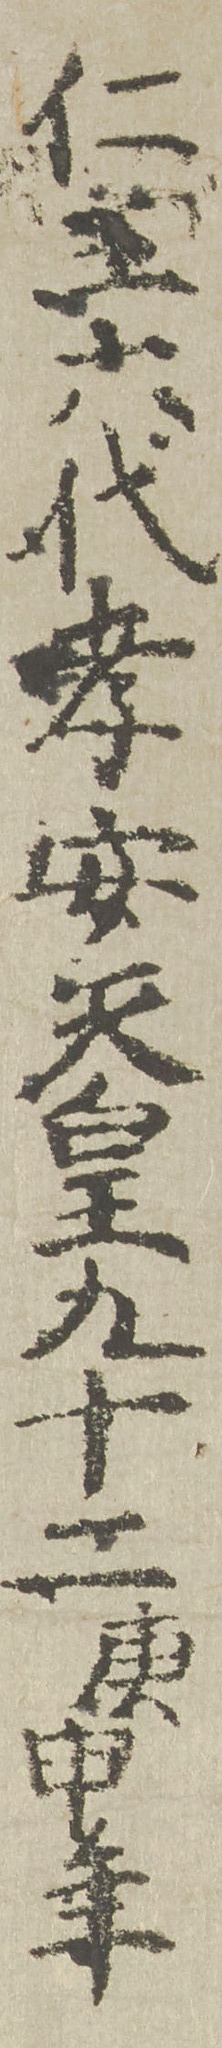仁王六代孝安天皇九十二庚申年
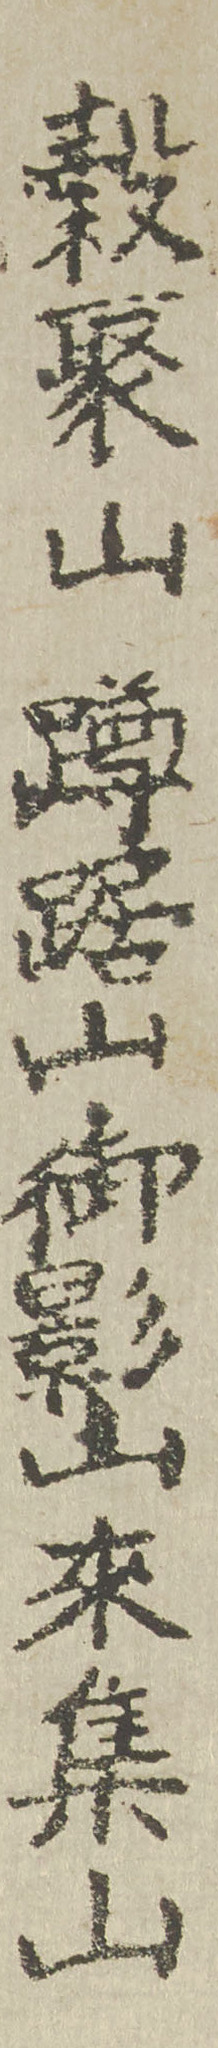穀集山蹲踞山御影山来集山
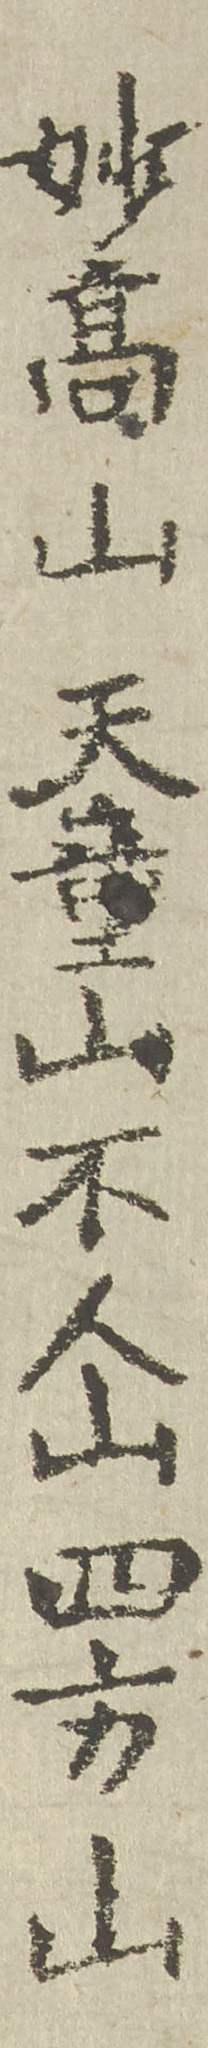妙高山天童山不人山四方山
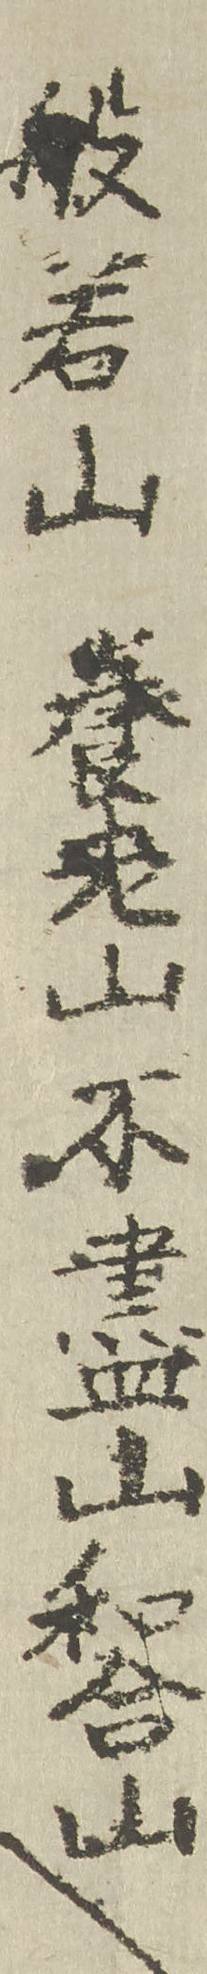般若山養老山不盡山和合山
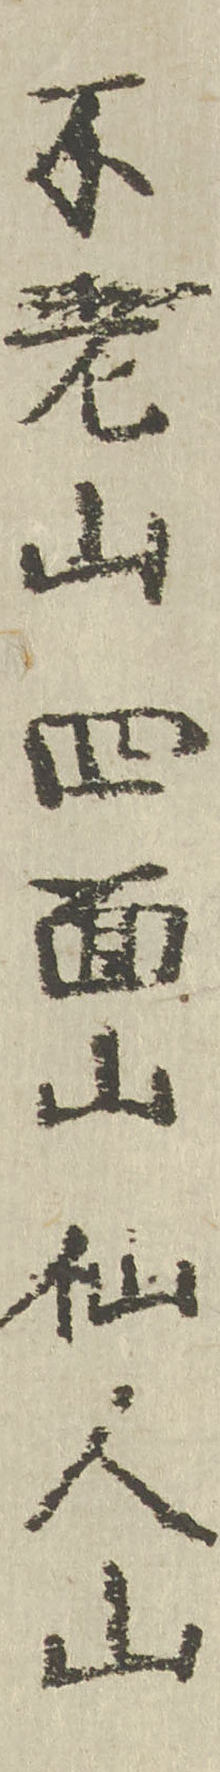不老山四面山仙人山
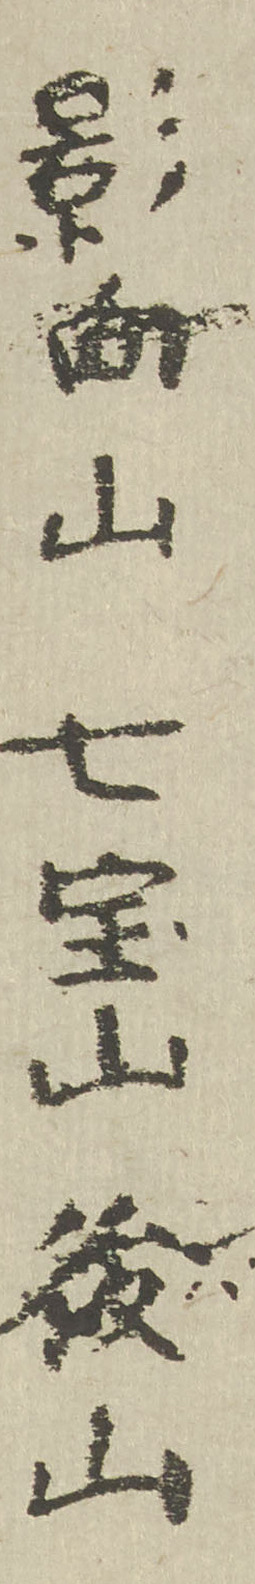影向山七宝山後山
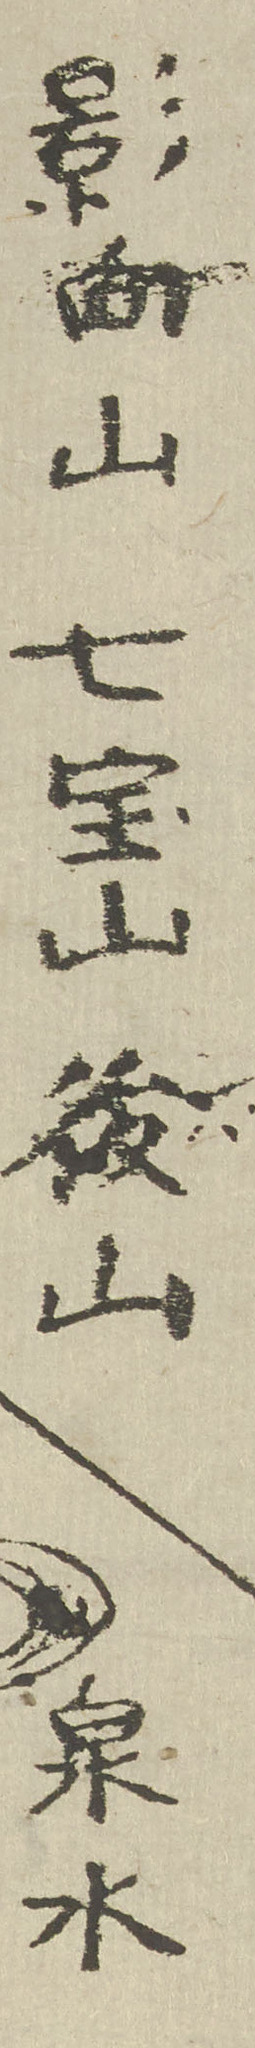影向山七宝山後山
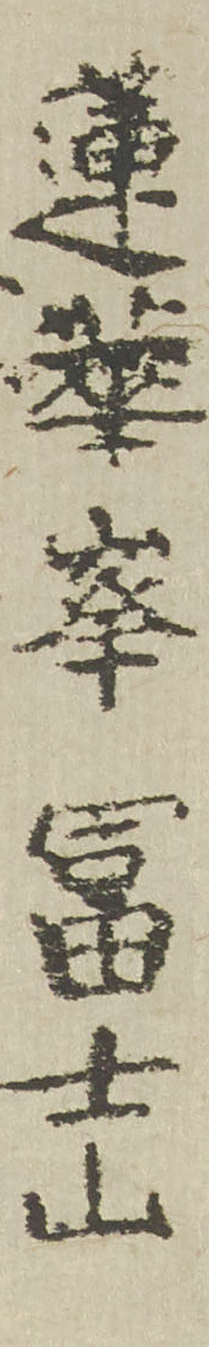蓮華峯冨士山
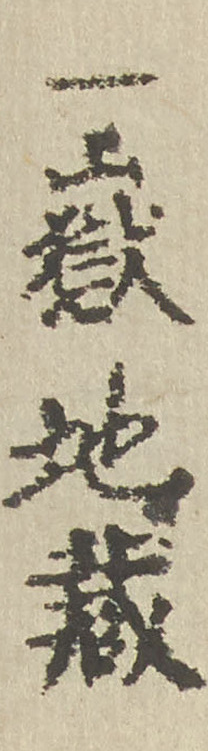一嶽地蔵
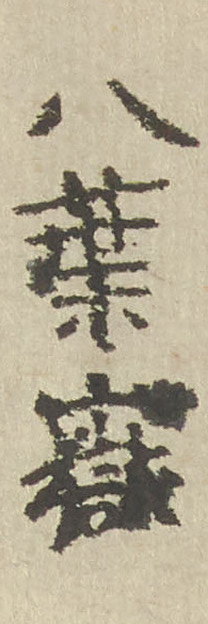八葉嶽
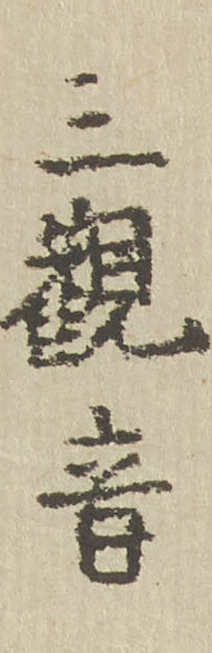三観音
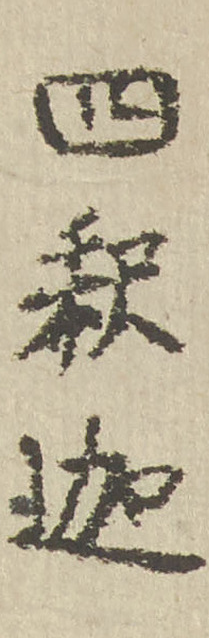四釈迦
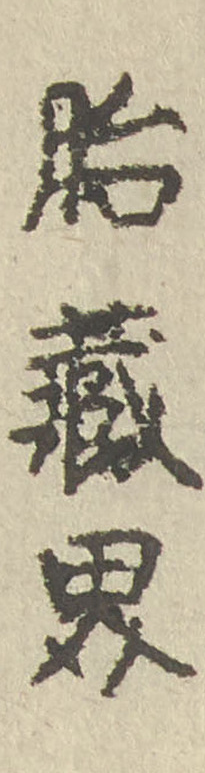胎蔵界
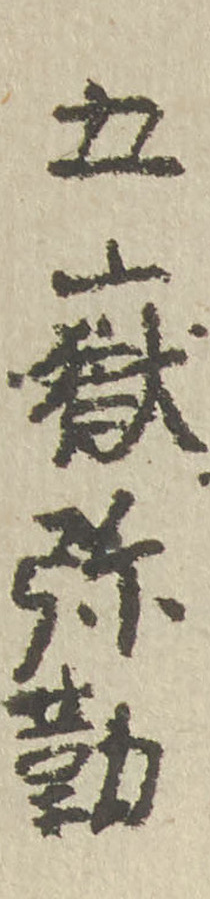五嶽弥勒
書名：三国第一富士山禅定図
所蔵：東京大学総合図書館 General Library in the University of Tokyo, JAPAN
